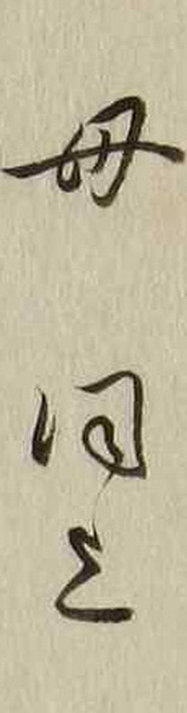母同上
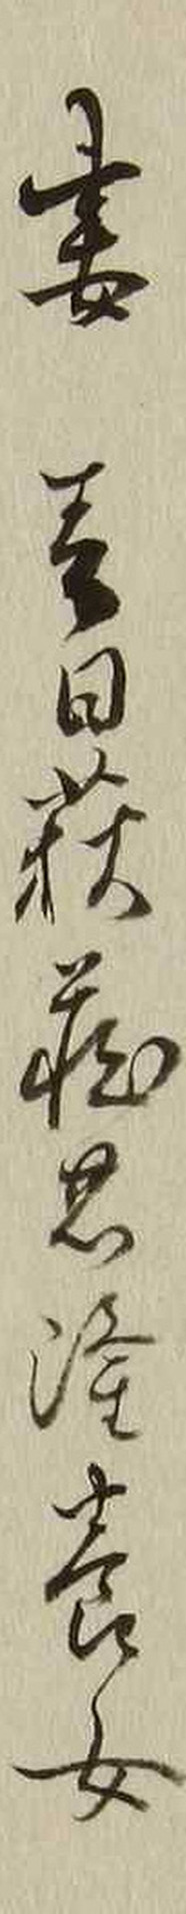妻青田萩蔵忍隆養女
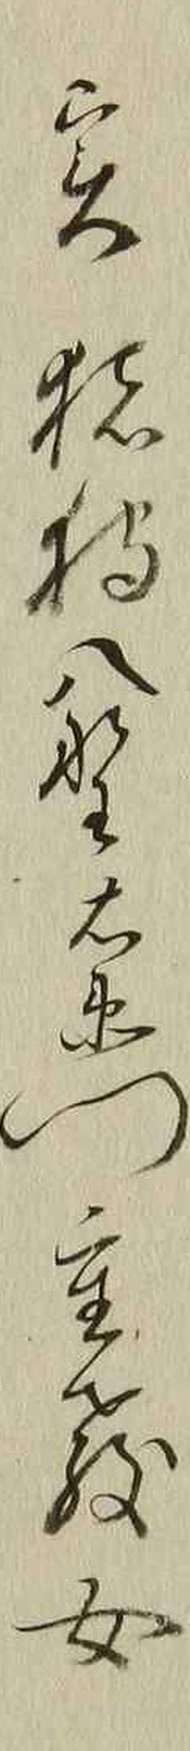実猪狩八野右衛門重教女
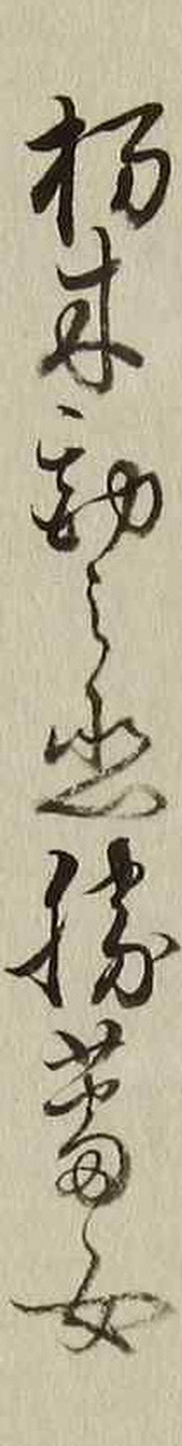柏木勘之丞勝蕃女
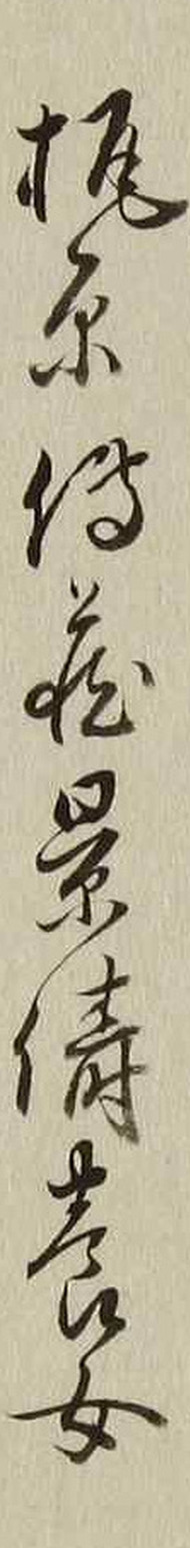梶原伝蔵景儔養女
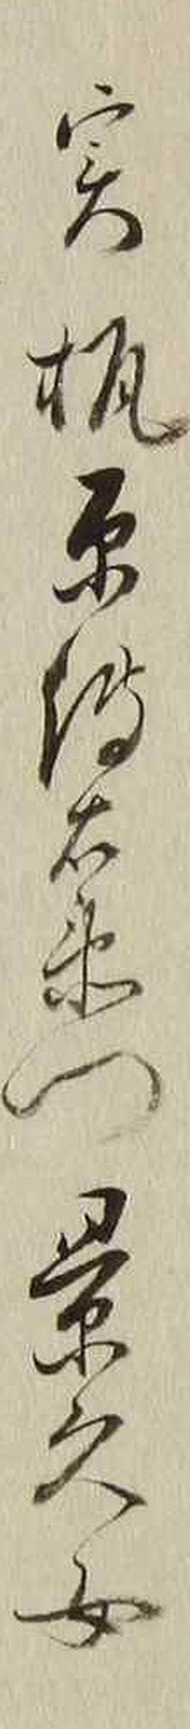実梶原伝右衛門景久女
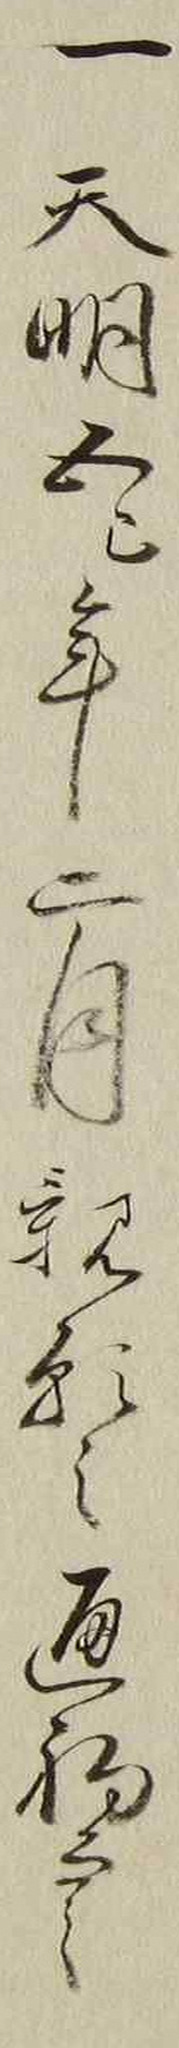一天明五巳年二月親願之通初而之
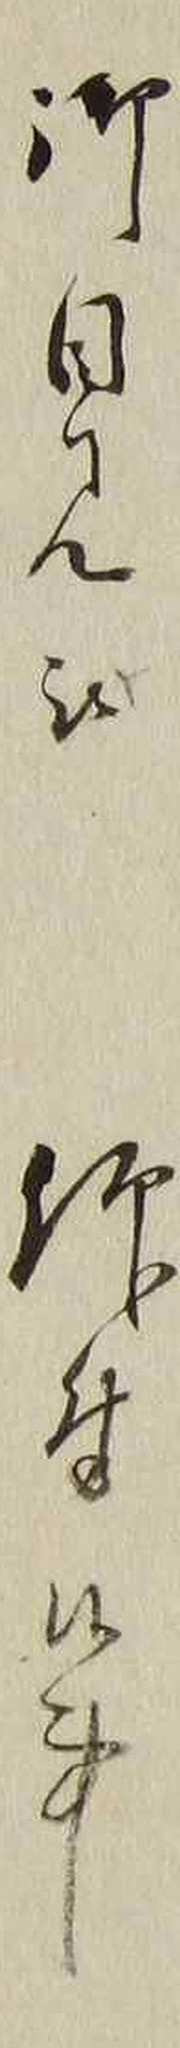御目見被仰付候事
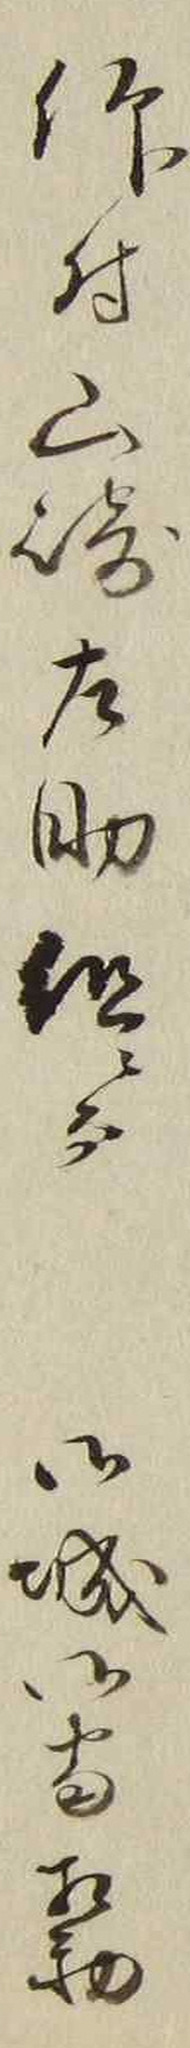仰付山崎佐助組ニ付御城番相勤

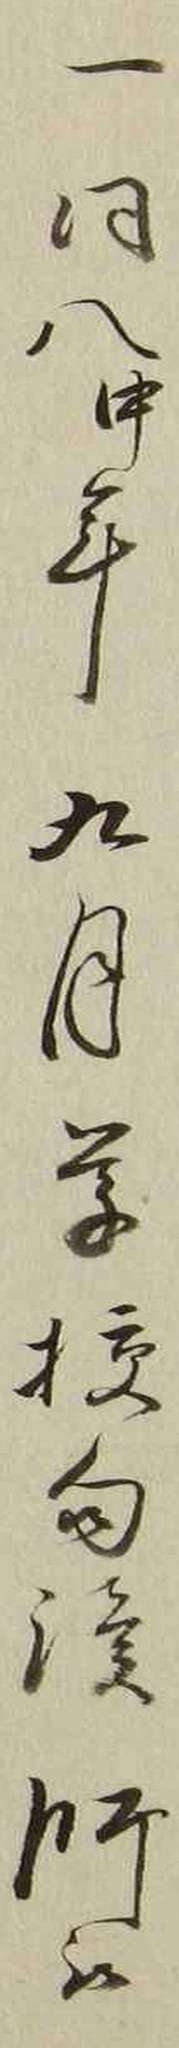一同八申年九月学授句読師被
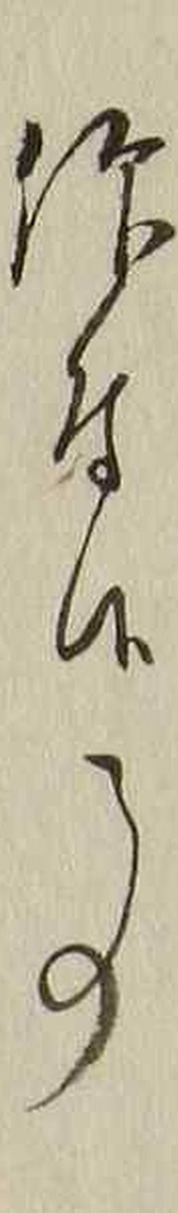仰付候事
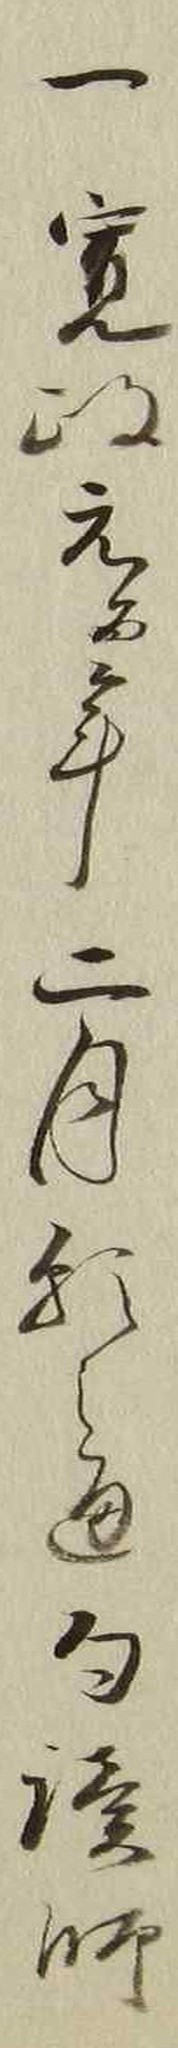一寛政元酉年二月願之通句読師
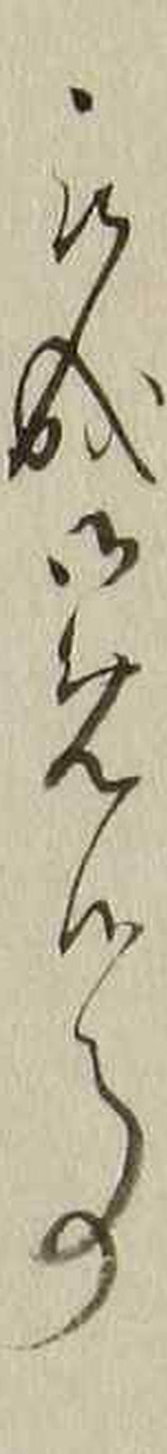被成御免候事
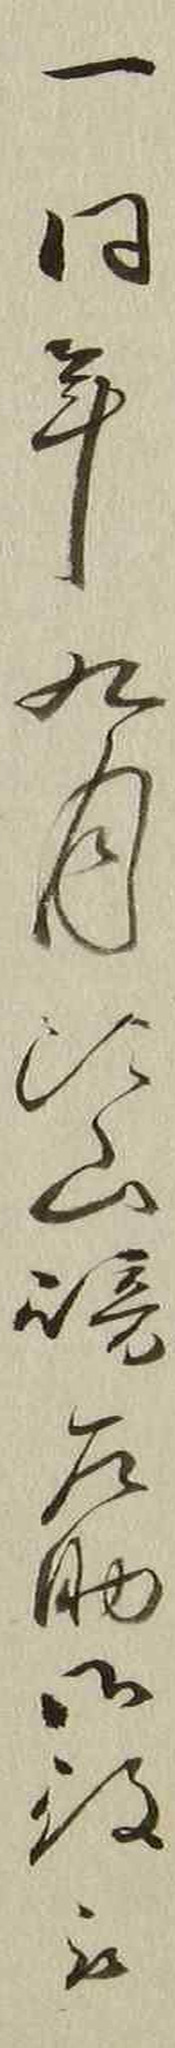一同年九月頭山崎左助御役被
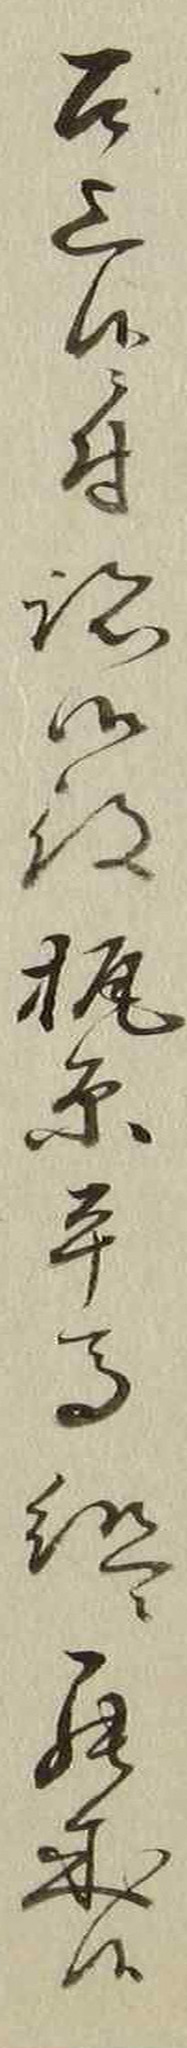召上候ニ付跡御役梶原平馬組ニ罷成候
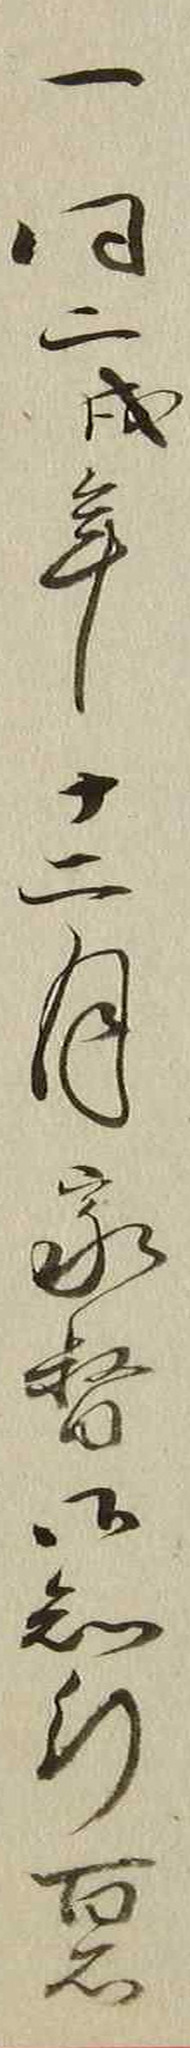一同二戌年十二月家督御知行百石
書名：諸士系譜　巻之52　に之部3
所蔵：会津若松市立会津図書館
